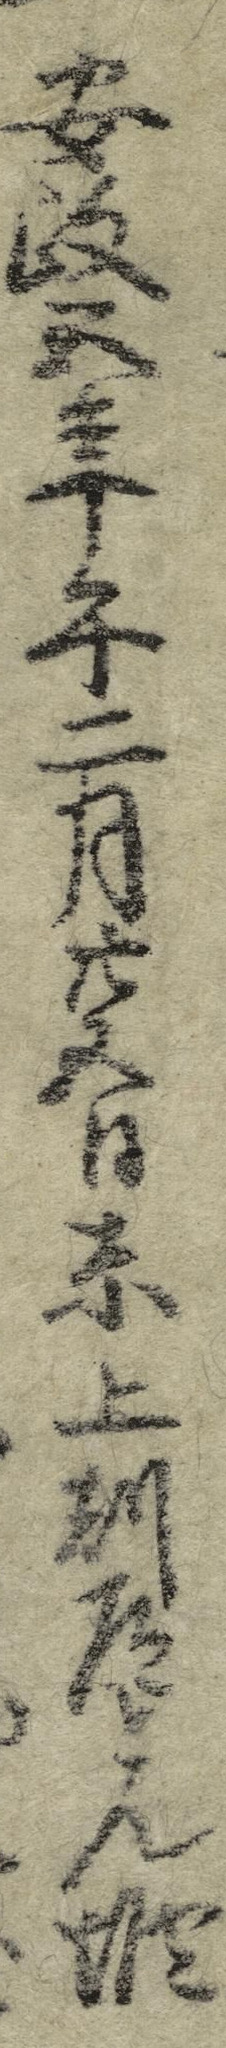安政五年午二月二十五日未上刻道とん堀
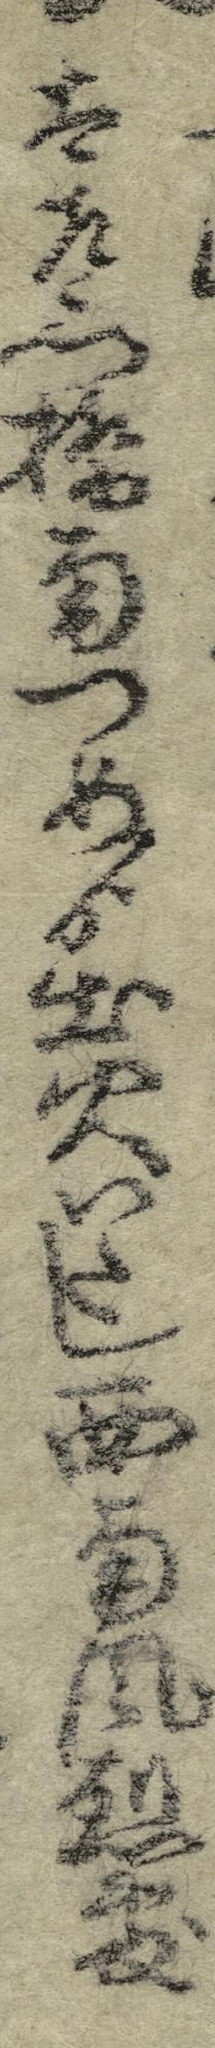太左衛門橋南つめより出火いたし西南風烈敷
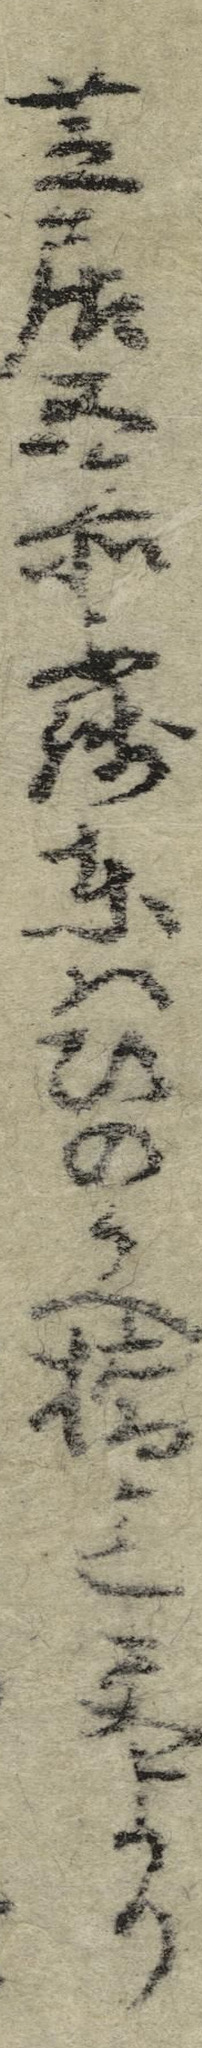芝居五ヶ所不残東ハひのうへ橋迄夫より
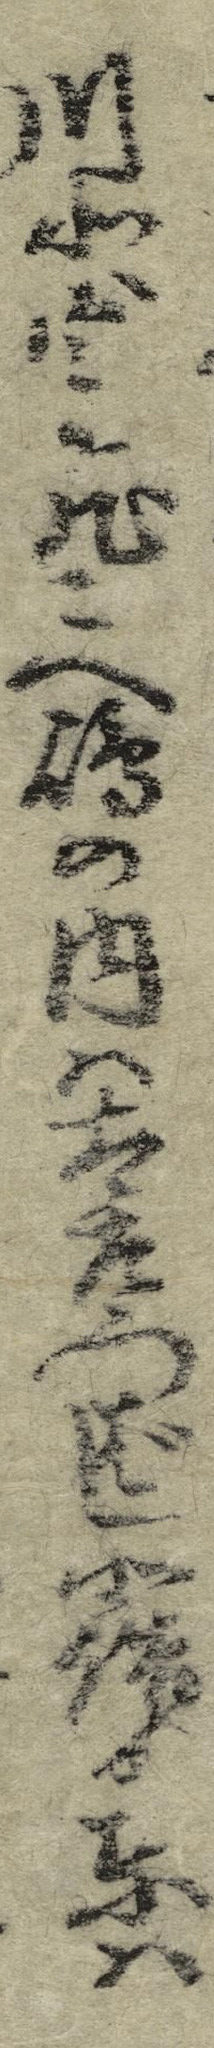川北へとびこへ島の内ハ太左衛門ばし北詰より東ハ
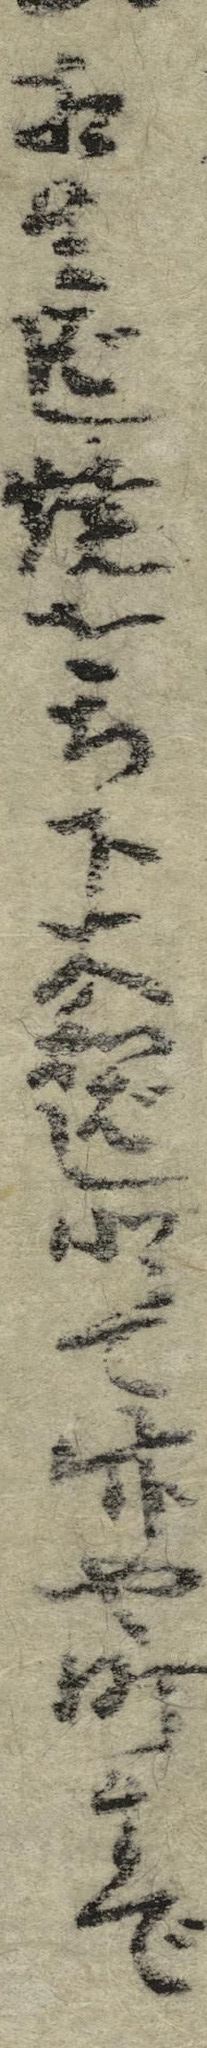相生ばし焼をち下大和ばし北ニて竹や町まで
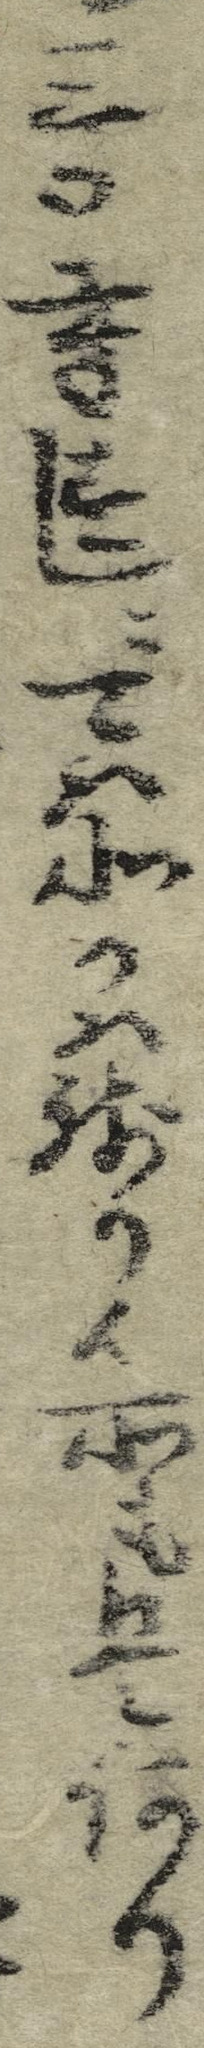三つ寺すしニてハ北かハ残り候所も是あり
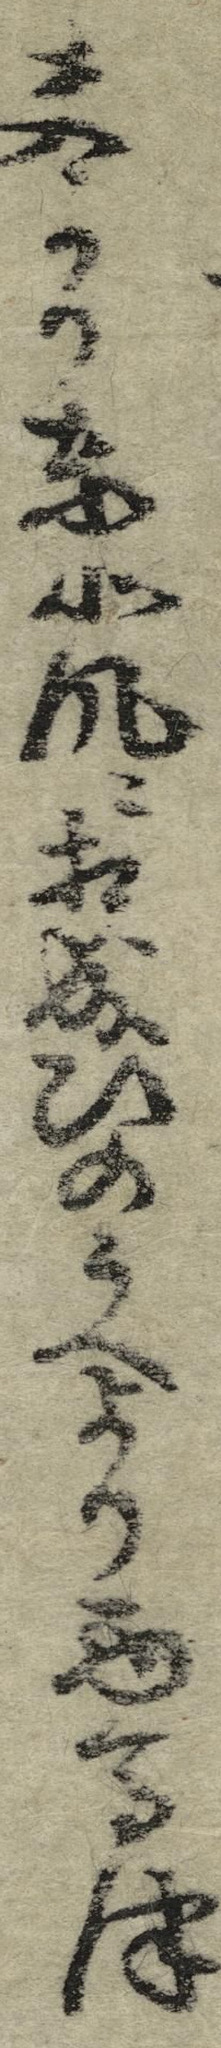夫より東北風ニ相成ひのうへより西高津
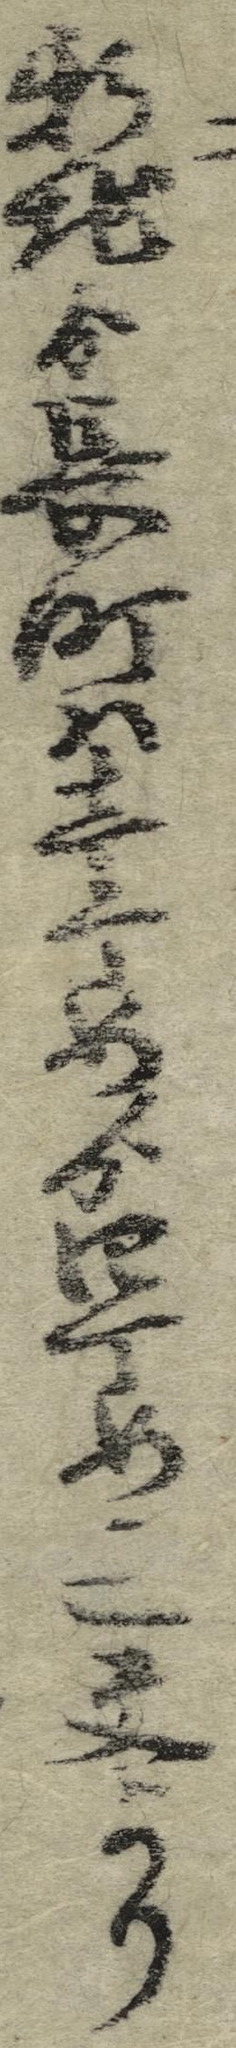新地より長町ハ一丁めより四丁め迄夫より
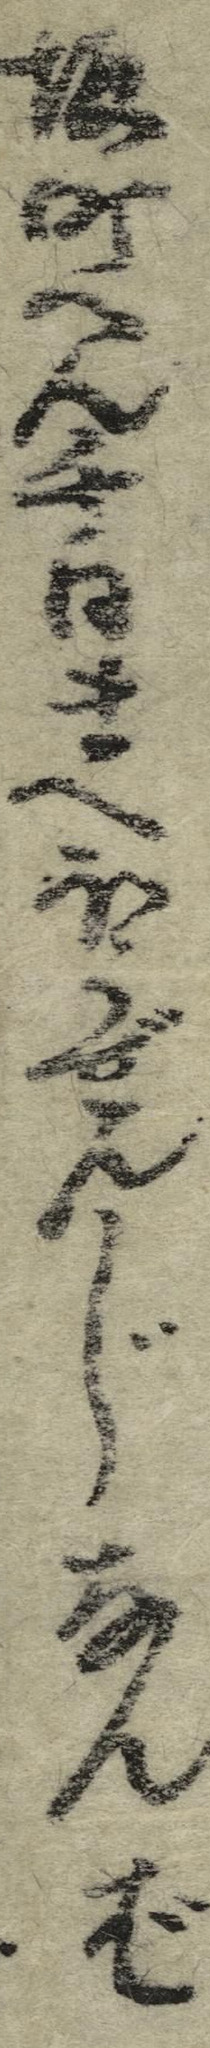坂町へん千日まへほうぜんじなんば
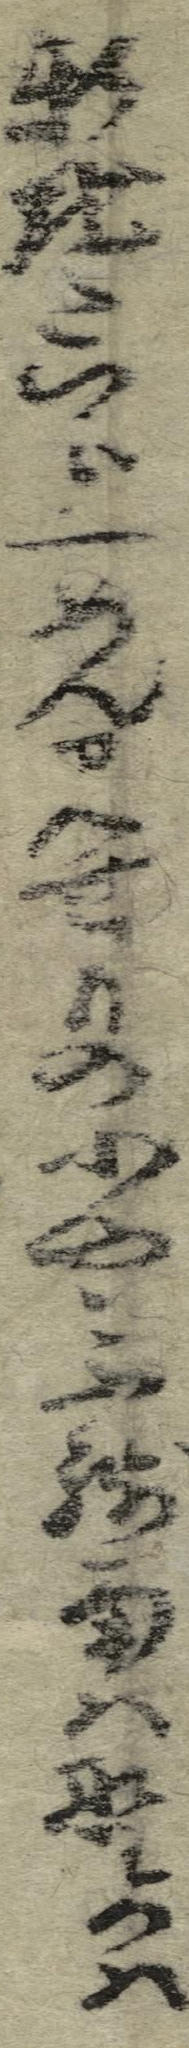新地たいら一めん見せもの小や不残南ハ野がハ
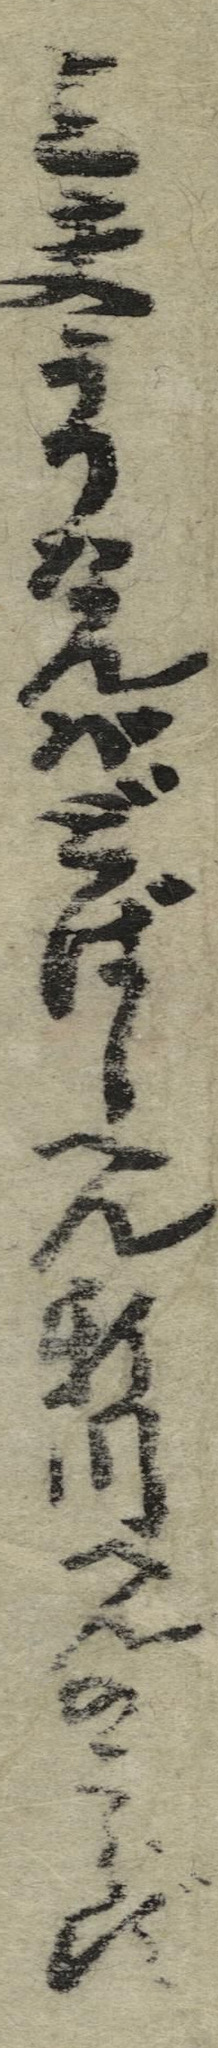迄夫よりなんバどばしへん新川へんのこらず
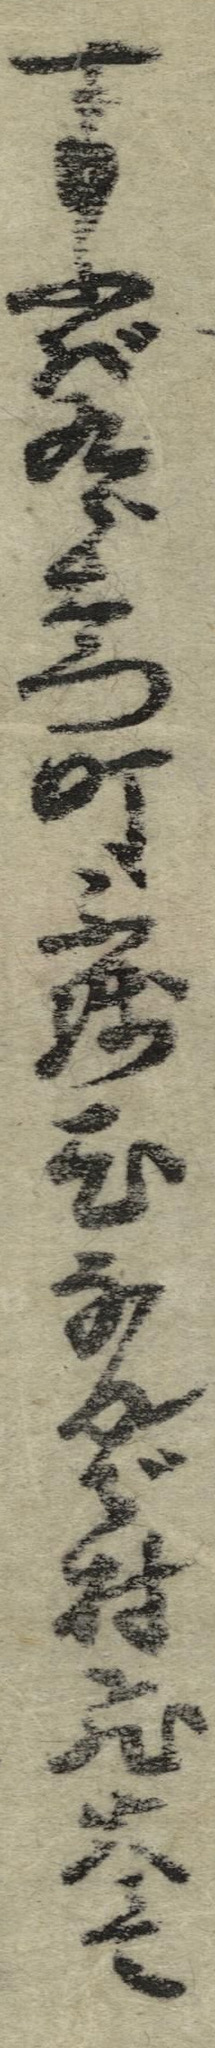すもふバ九郎右衛門町不残尤なんば村飛火ニて
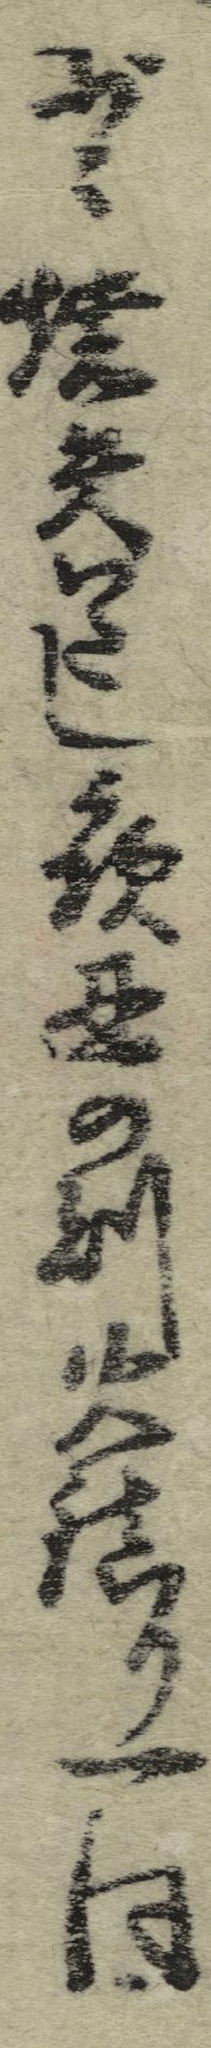少々焼失いたし夜丑の刻火鎮り一同
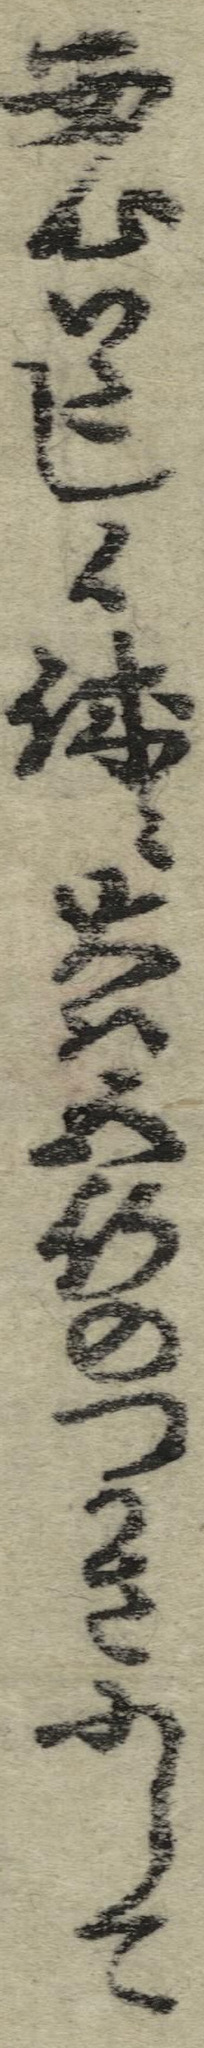安心いたし候誠ニ火ハ五行のつかさにして
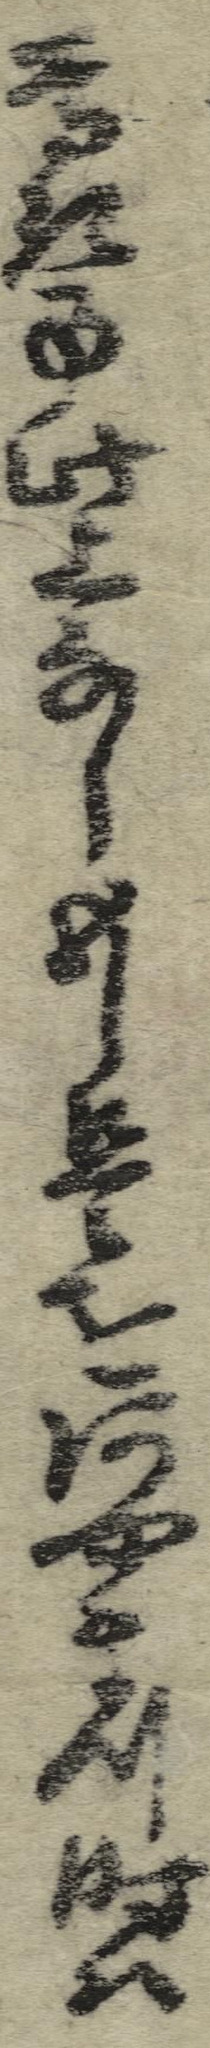尊き事此上なしもし是をあやまつ時ハ
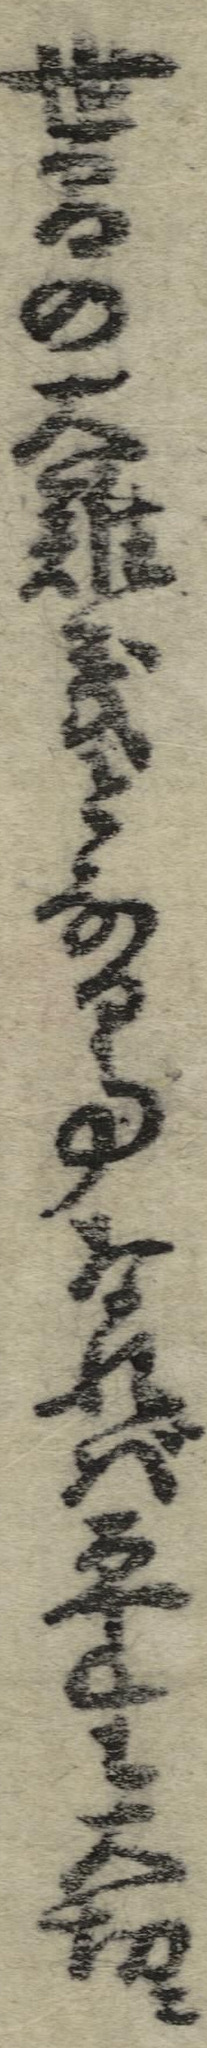世間の大難義となる事なれバ平生大切ニ
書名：大阪大火極細吟本しらべ
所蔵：東京大学地震研究所図書室 Earthquake Research Institute Library, The University of Tokyo, JAPAN
